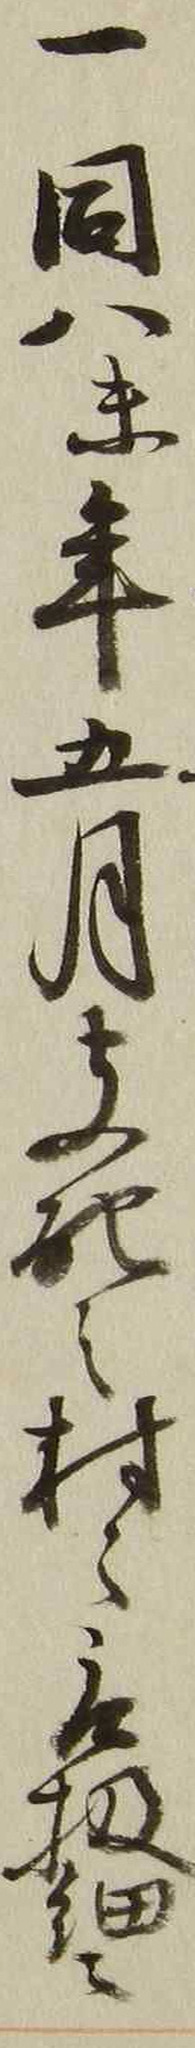一同八未年五月支配之村々取扱細々
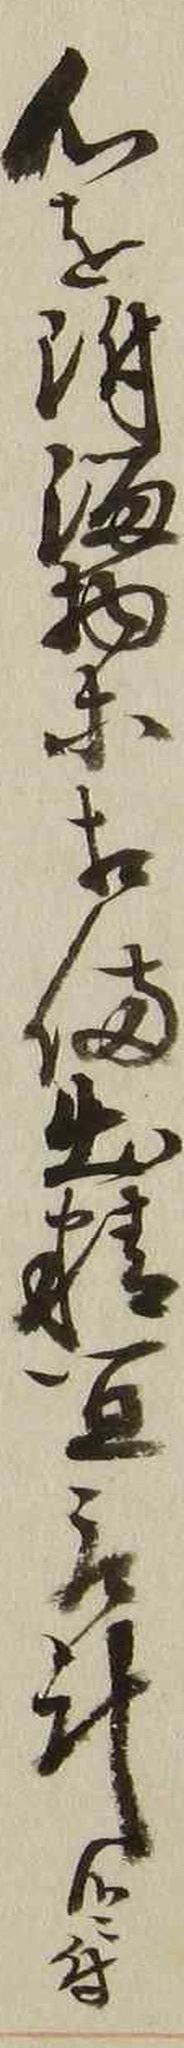心を附溜物等相備出精宜取計候ニ付
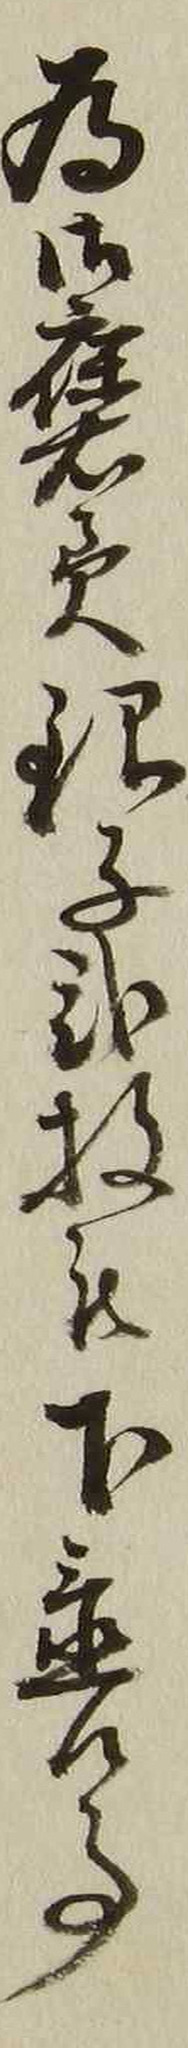為御褒美銀子弐枚被下置候事
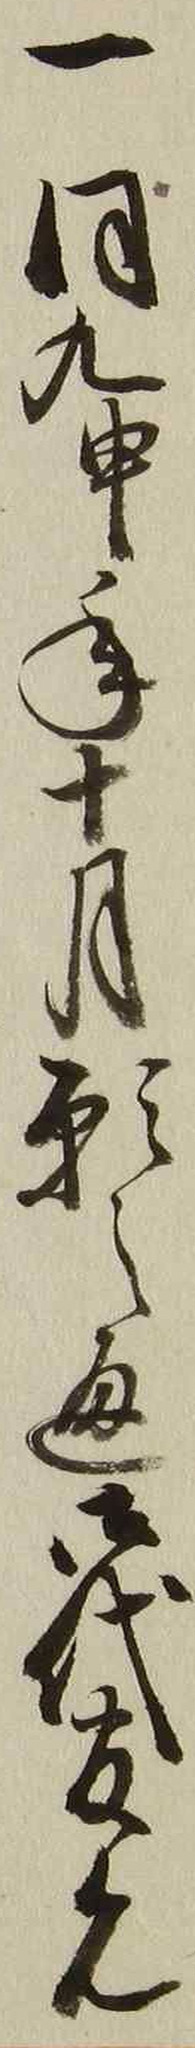一同九申年十月願之通御代官見
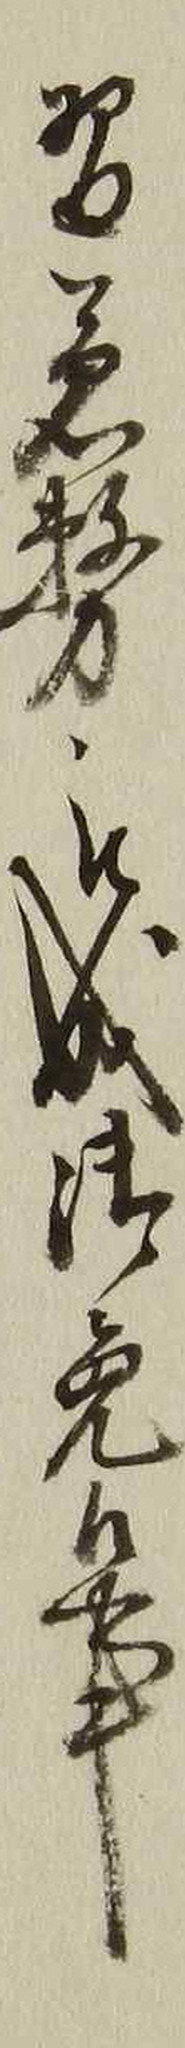習兼務被成御免候事
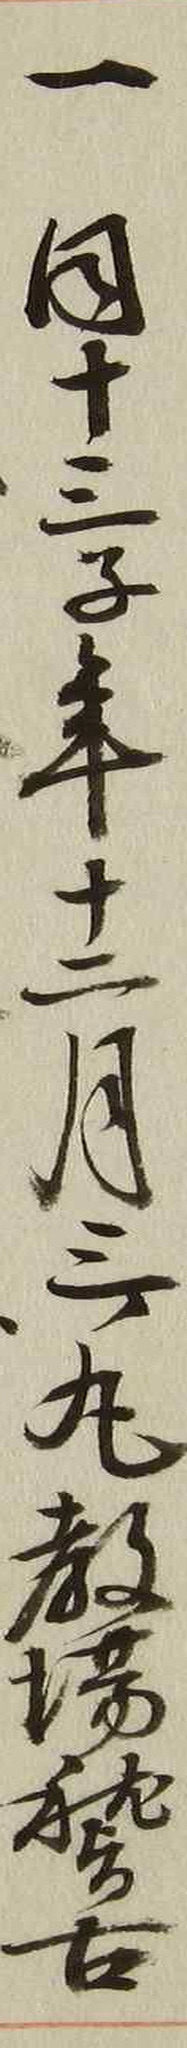一同十三子年十二月三ノ丸教場稽古
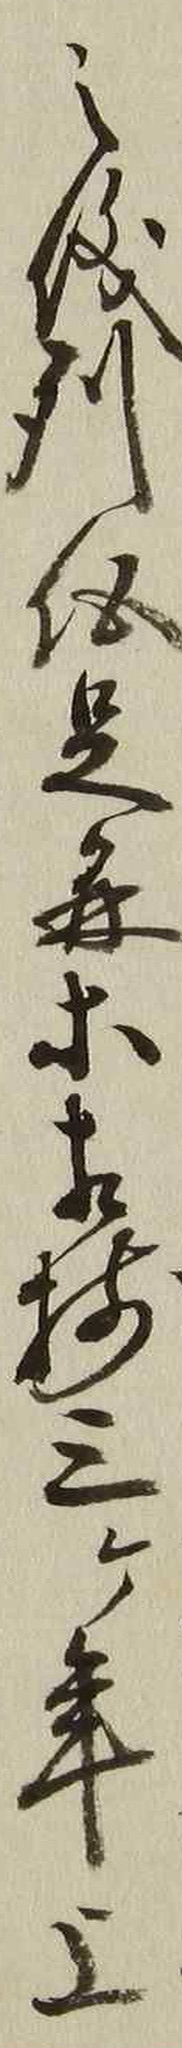之儀列伍足并等相揃三ケ年上
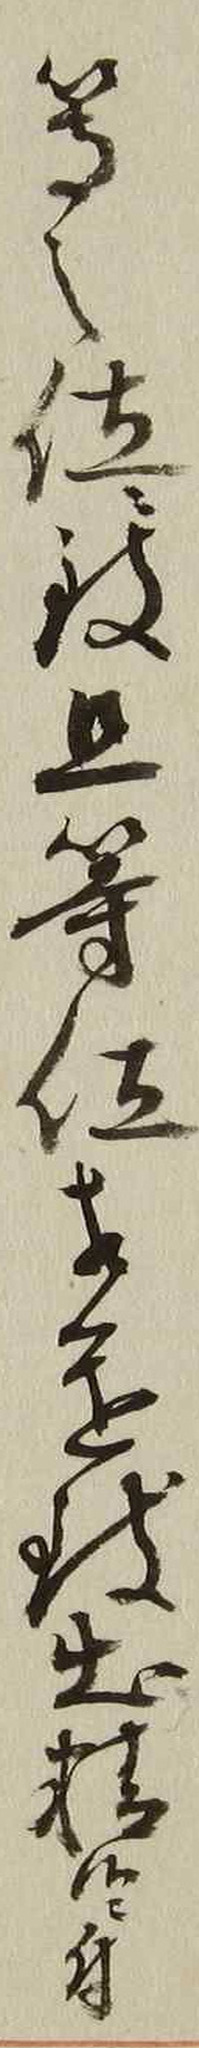等之位ニ致且等位相遂致出精候ニ付
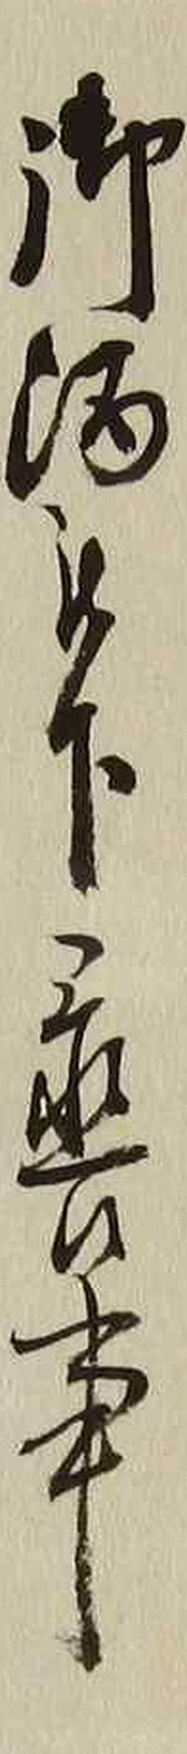御酒被下置候事
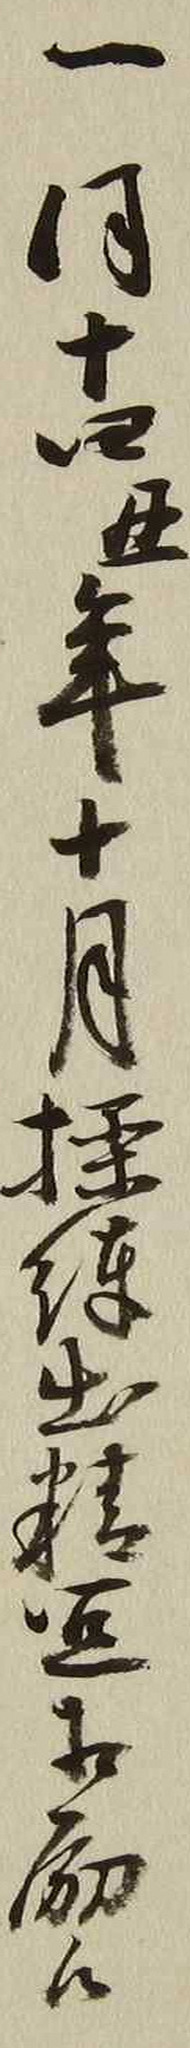一同十四丑年十月操練出精宜相励候
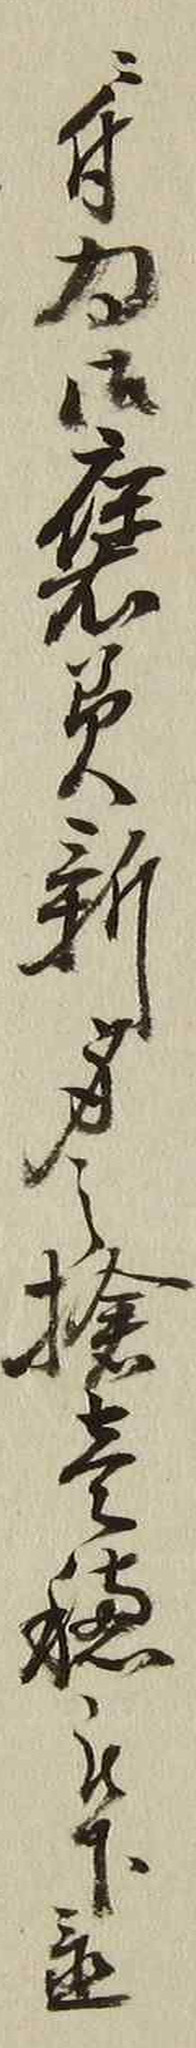ニ付為御褒美新身之槍壱穂被下置
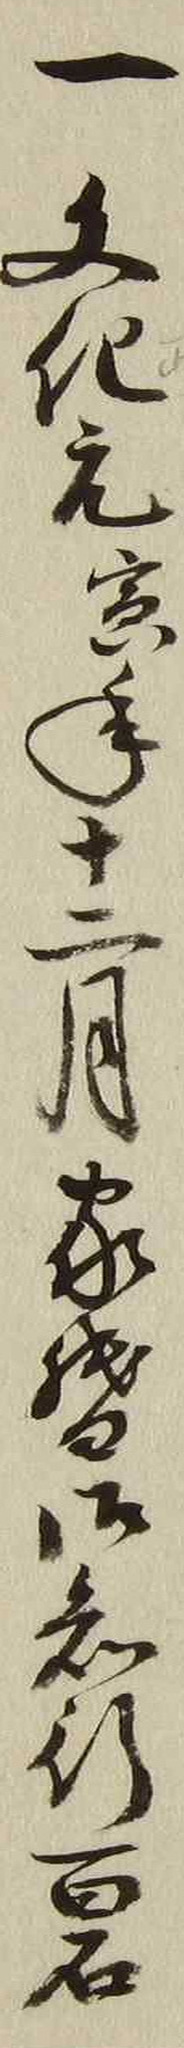一文化元寅年十二月家督御知行百石
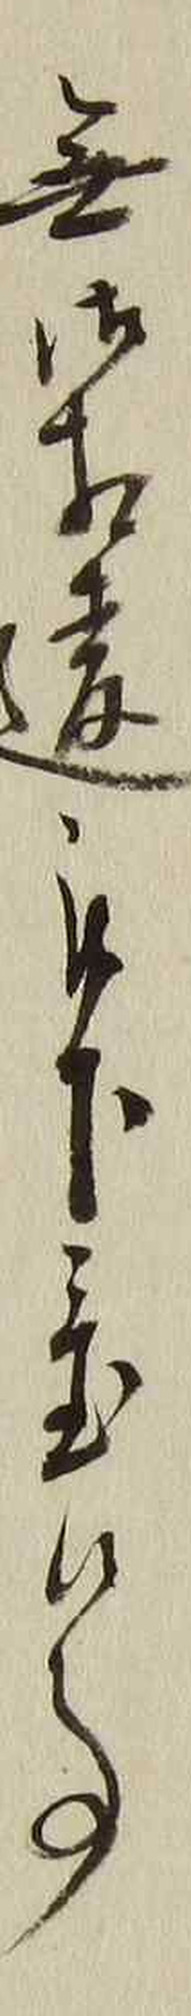無御相違被下置候事
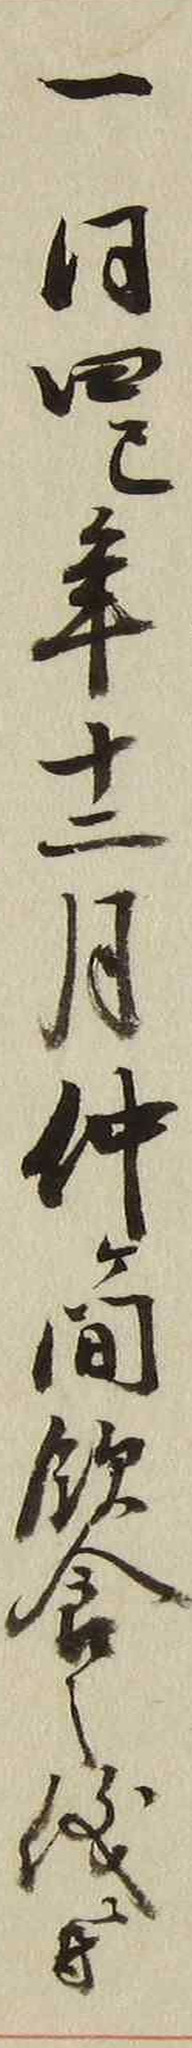一同四巳年十二月仲ケ間飲食之儀ニ付
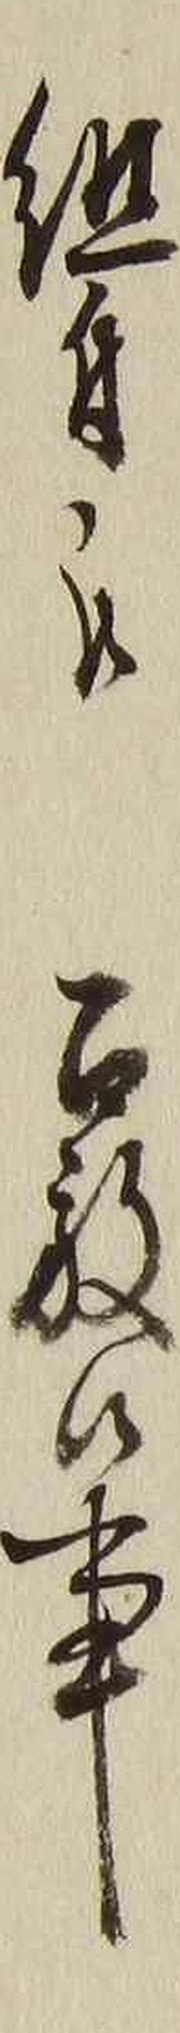組付被召放候事
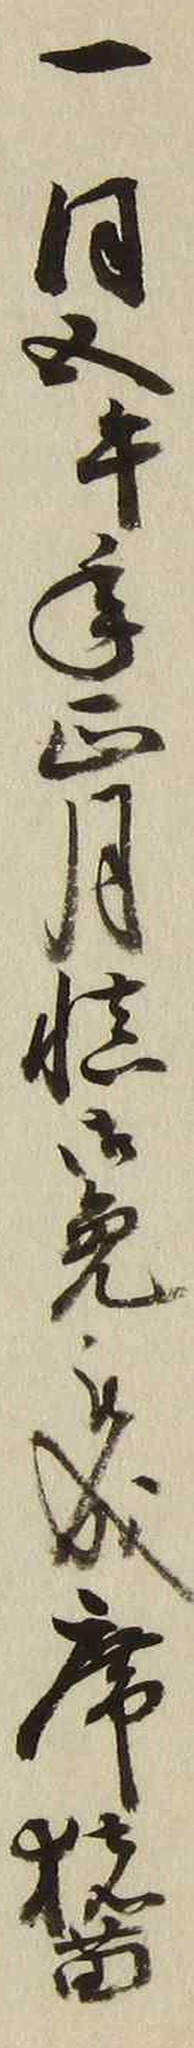一同五午年正月慎御免被成席猪苗
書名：諸士系譜　巻之27　い之部27
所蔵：会津若松市立会津図書館
